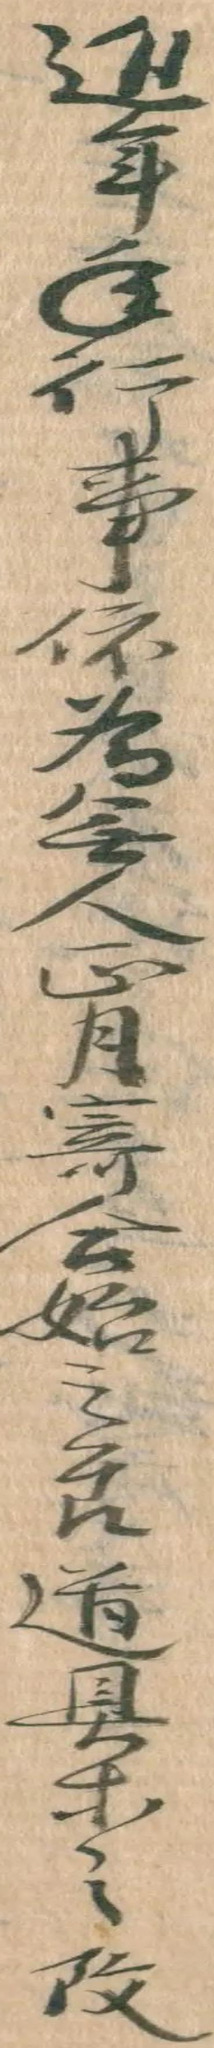一近年年年行事依為無人正月寄合始之節道具等之改
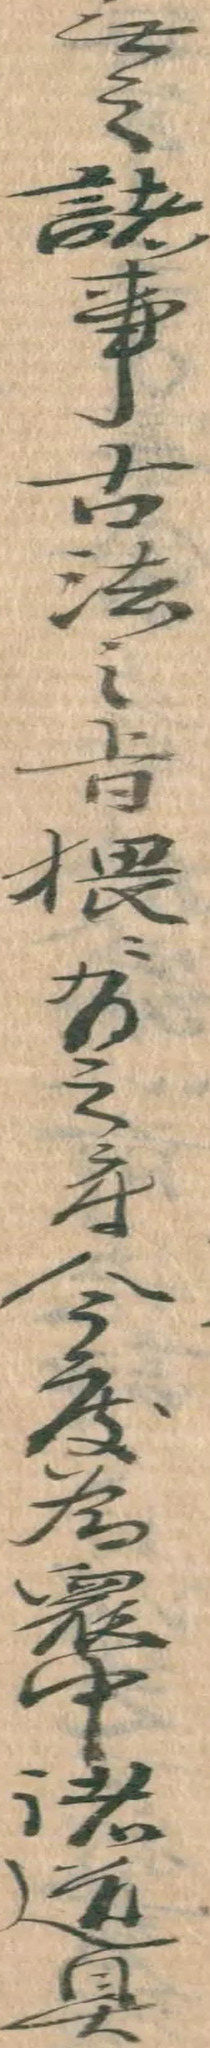無之諸事古法之旨猥ニ有之ニ付今度為衆中諸道具
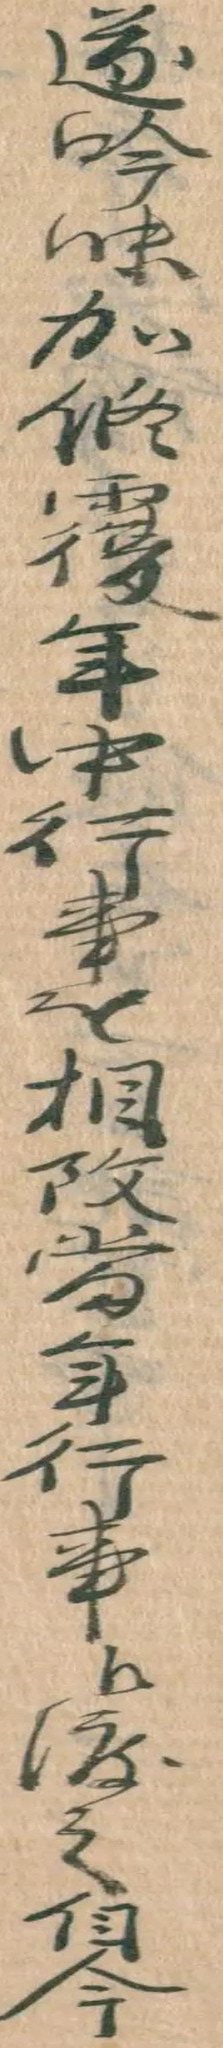遂吟味加修覆年中行事を相改當年行事江渡之自今
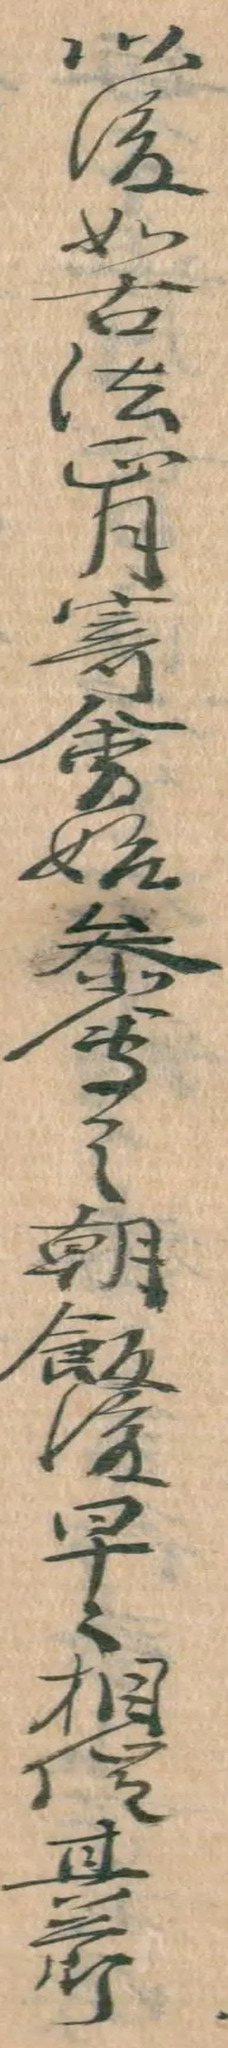以後如古法正月寄會始参會之朝飯後早々相催其節
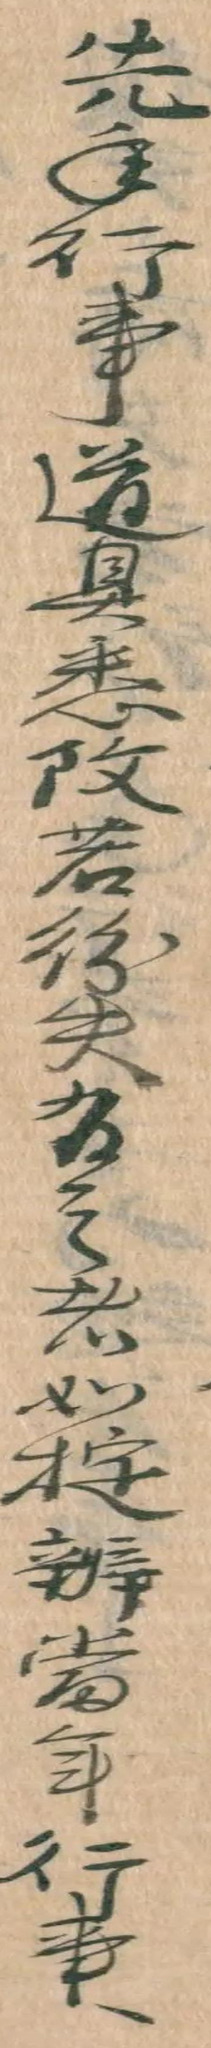先年行事道具悉改若紛失有之者如掟辨當年行事ヘ
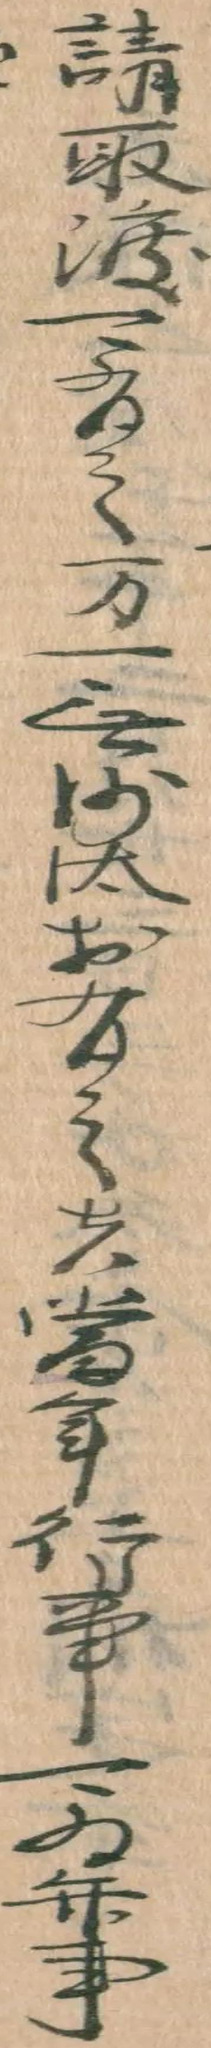請取渡可有之万一無沙汰於有之者當年行事可為弁事
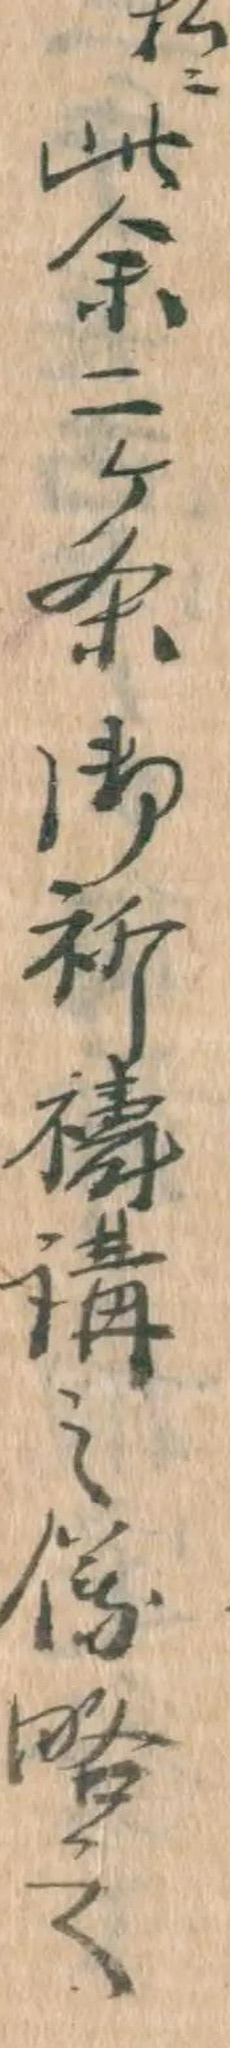私ニ此余二ヶ条御祈祷講之儀略之
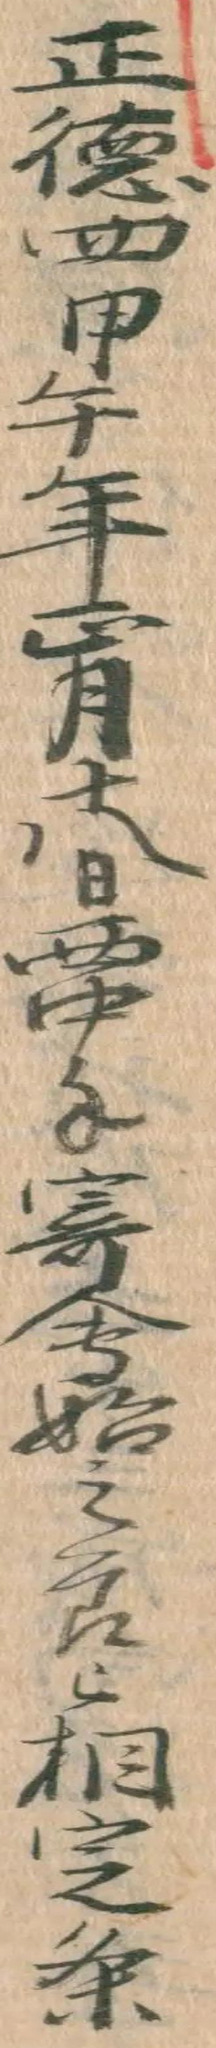正徳四甲午年正月十八日西中手寄會始之節被相定条
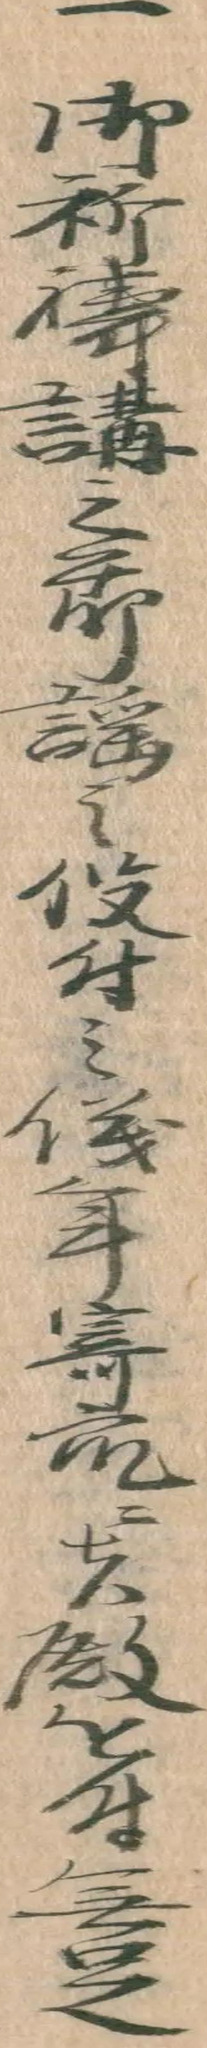一御祈祷講之節謡之役付之儀年寄衆ニは殿を付無足
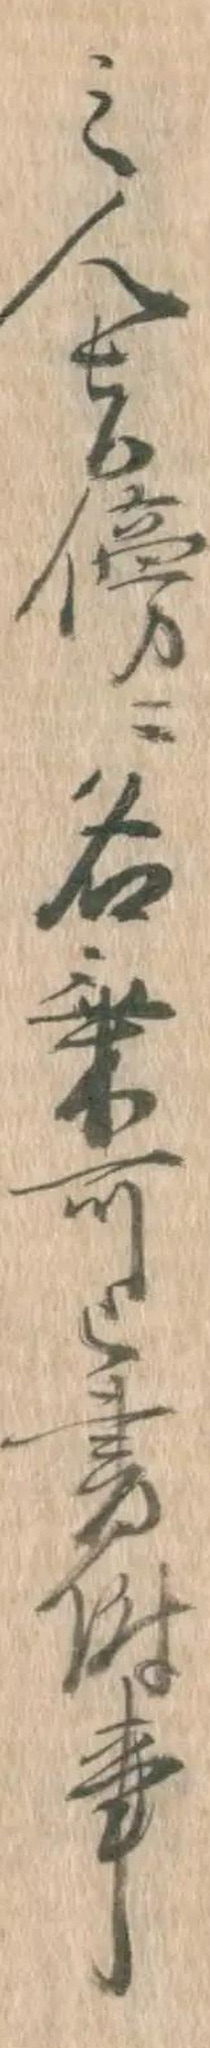之人は傍ニ名乗可被書附事
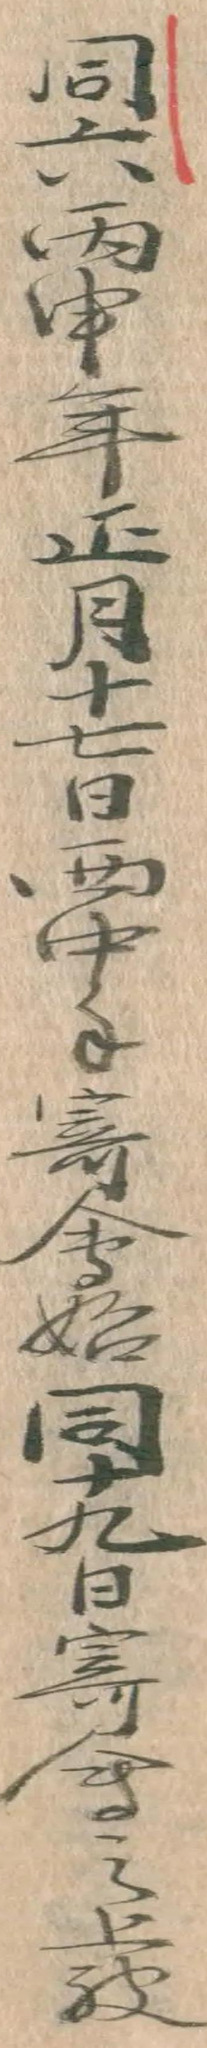同六丙申年正月十七日西中手寄會始同十九日寄會之上被
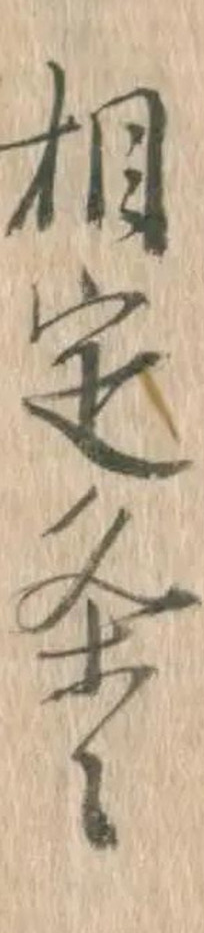相定条々
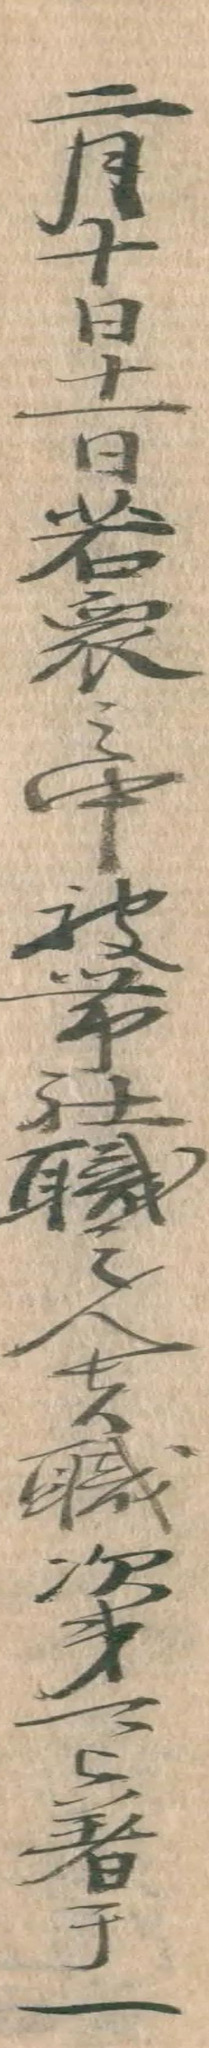一二月十日十一日若衆之中被帯社職之人は職次第可被着于一
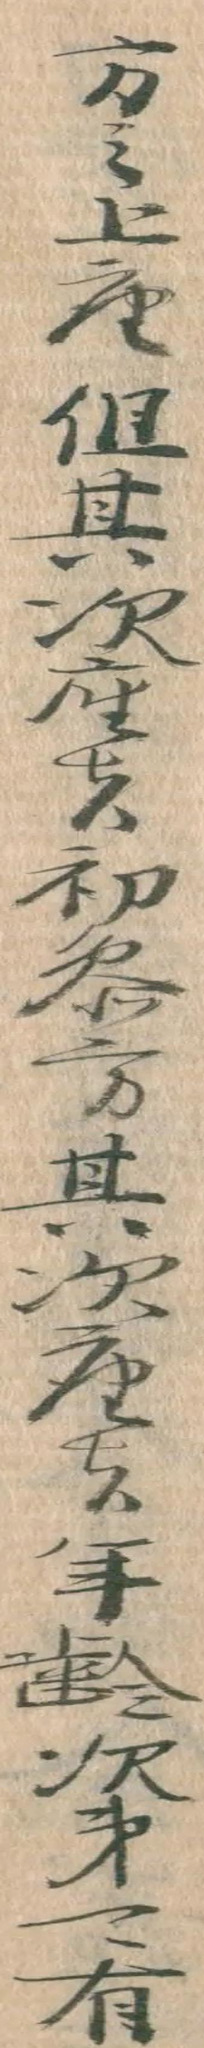方之上座但其次座は初参方其次座は年齢次第可有
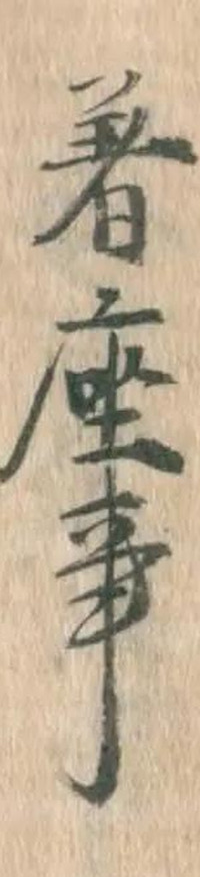着座事
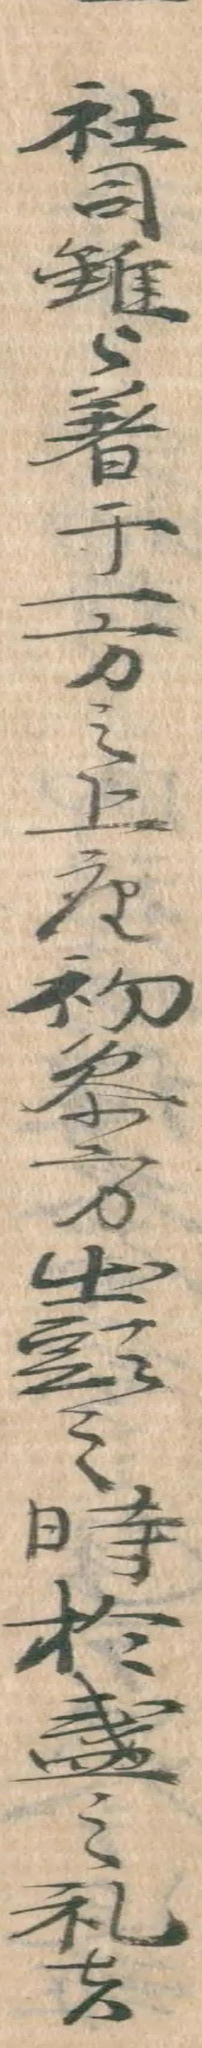一社司雖被着于一方之上座初参方出頭之時於盞之礼者
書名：賀茂社記録. 第29冊
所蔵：国立国会図書館 National Diet Library, JAPAN
